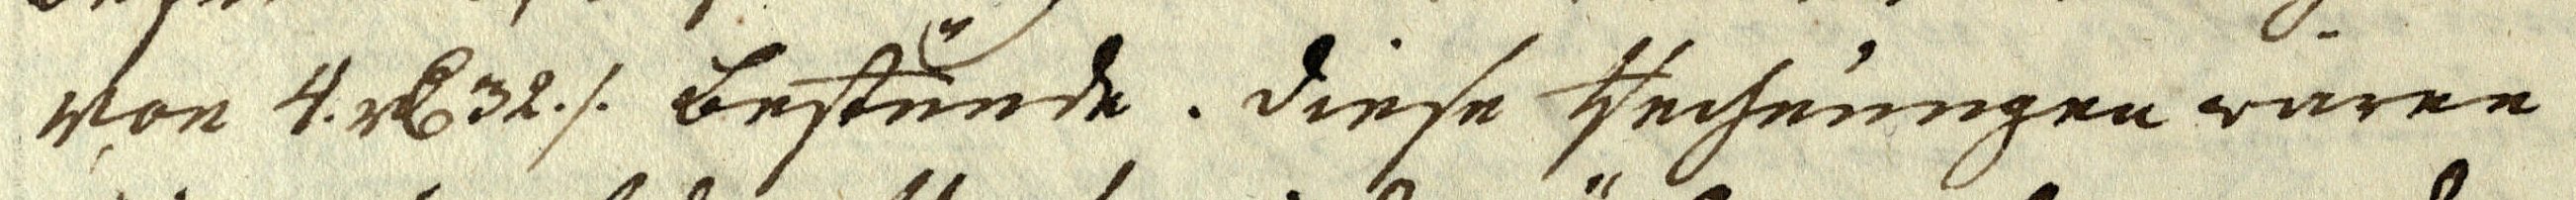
von 4 rl. 32. s. bestünde. Diese Rechnungen wären
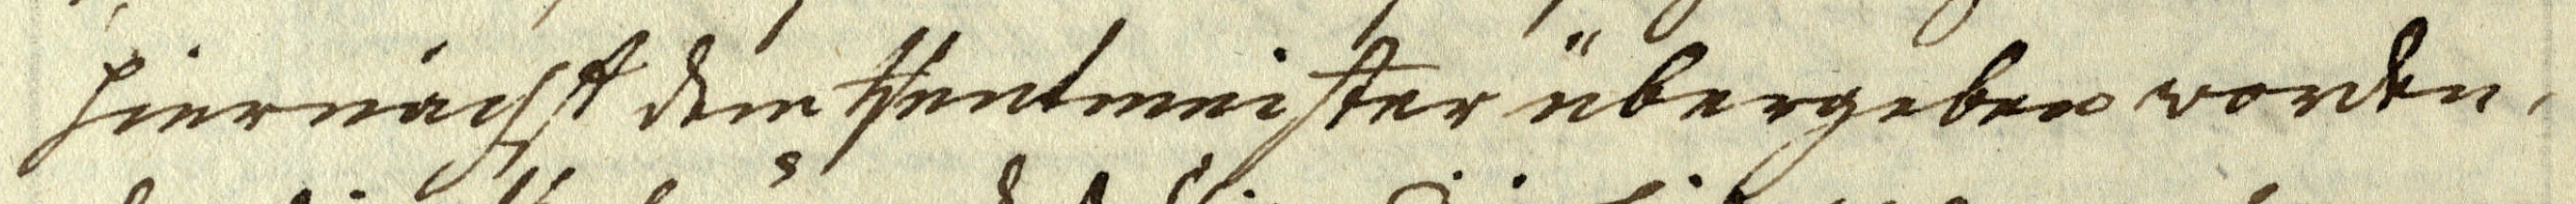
hiernächst dem Rentmeister übergeben worden,
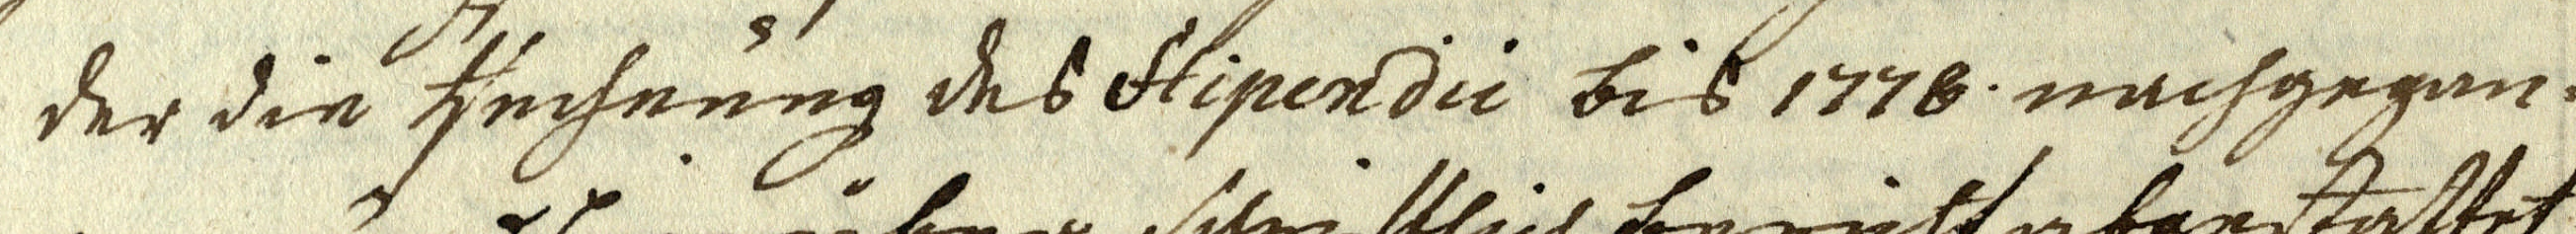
der die Rechnung des Stipendii bis 1778 nachgegan¬
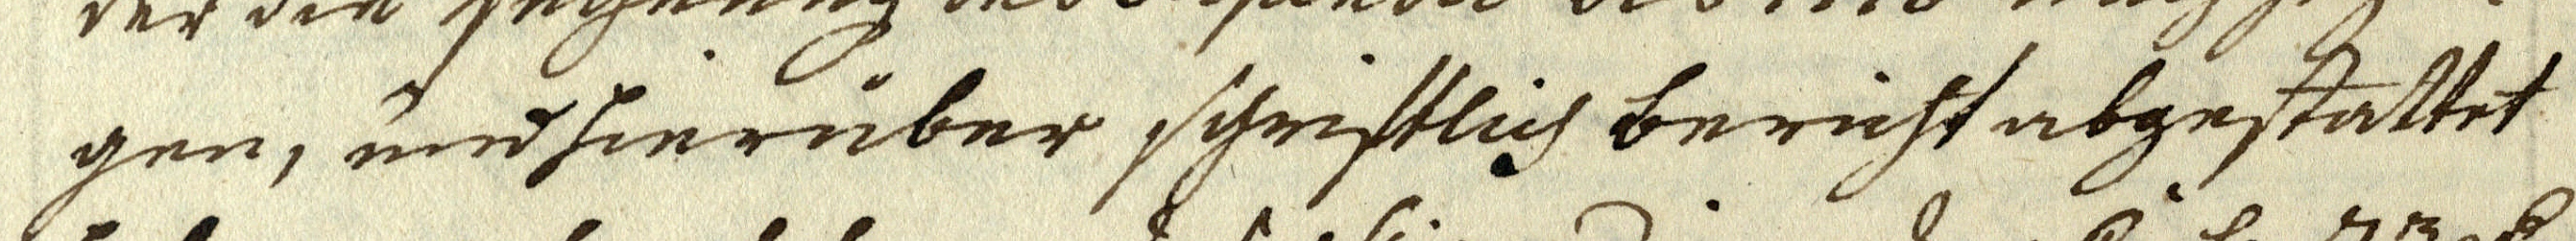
gen, und hierüber schriftlich Bericht abgestattet
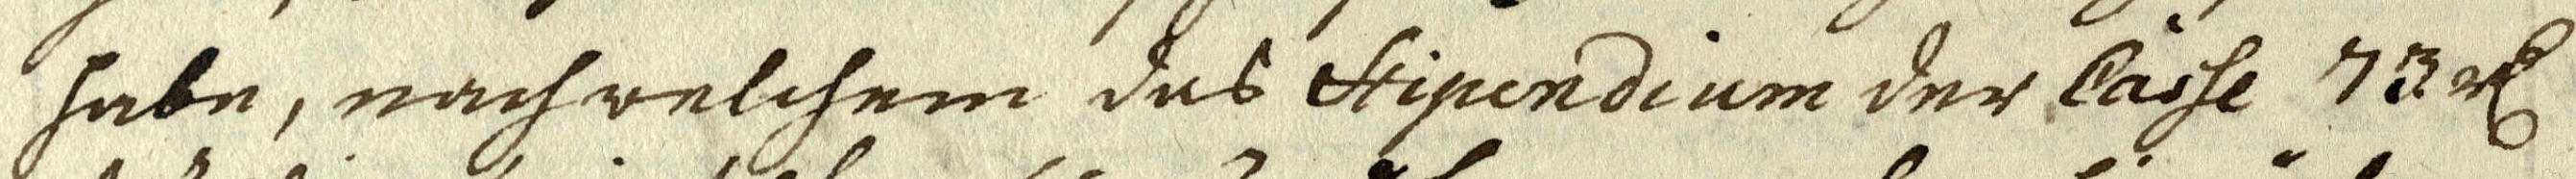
habe, nach welchem das Stipendium der Casse 73 rl.
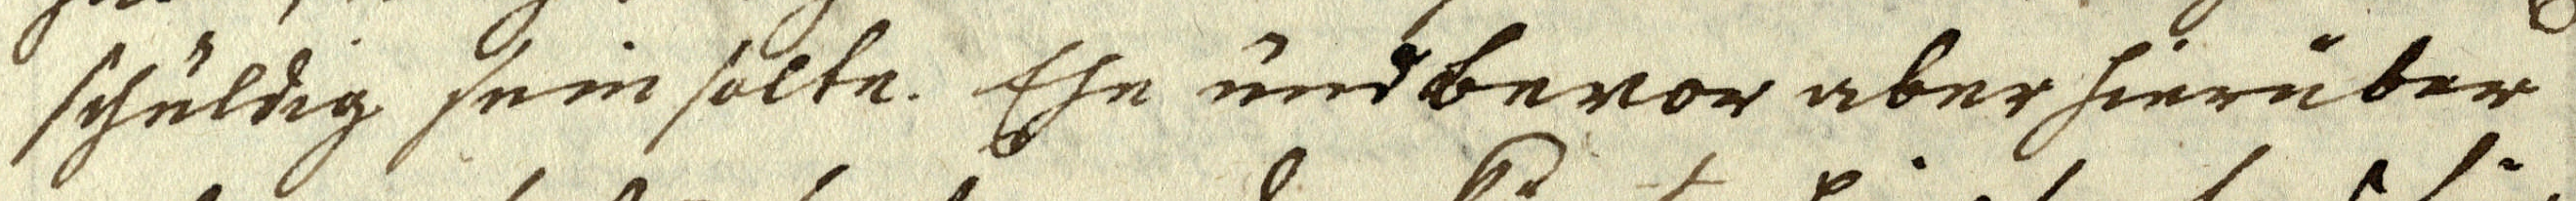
schuldig sein solte. Ehe und bevor aber hierüber
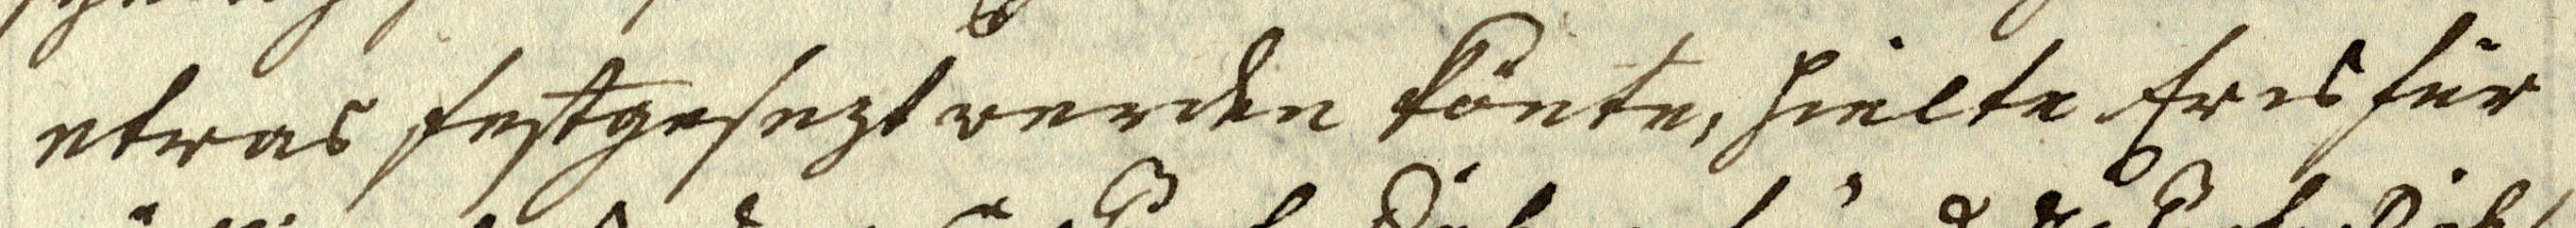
etwas festgesezt werden könte, hielte Er es für
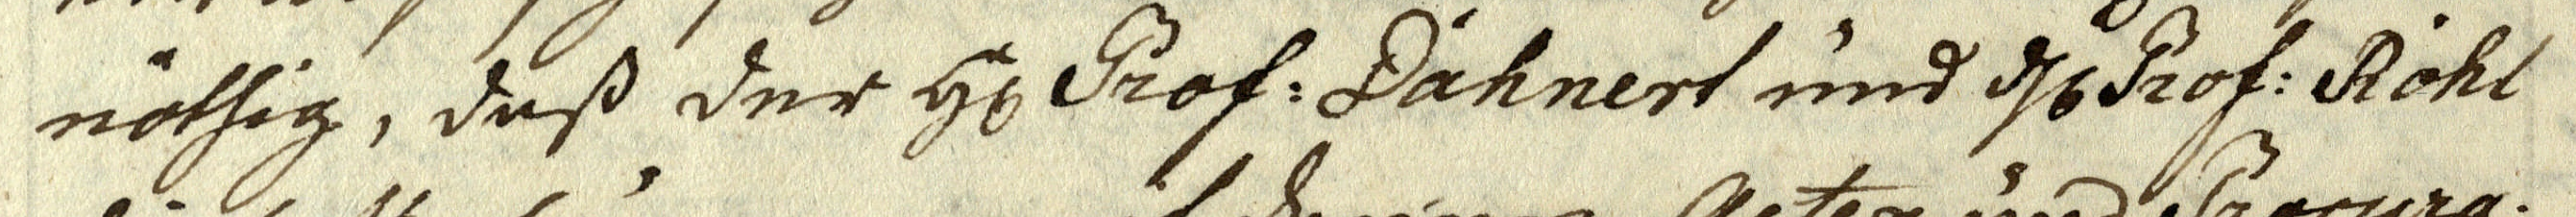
nöthig, daß der H. Prof. Dähnert und dh. Prof. Röhl
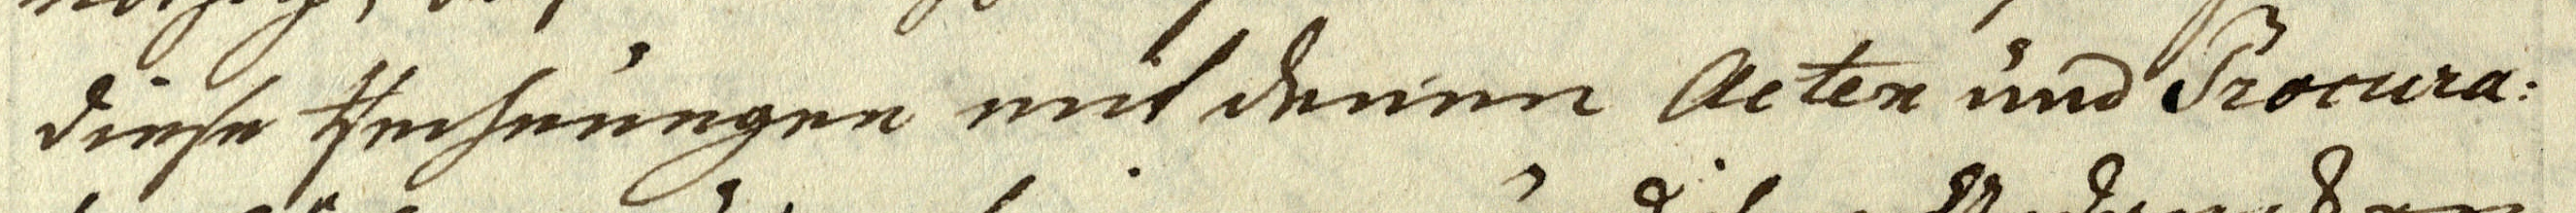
diese Rechnungen mit denen Acten und Procura¬
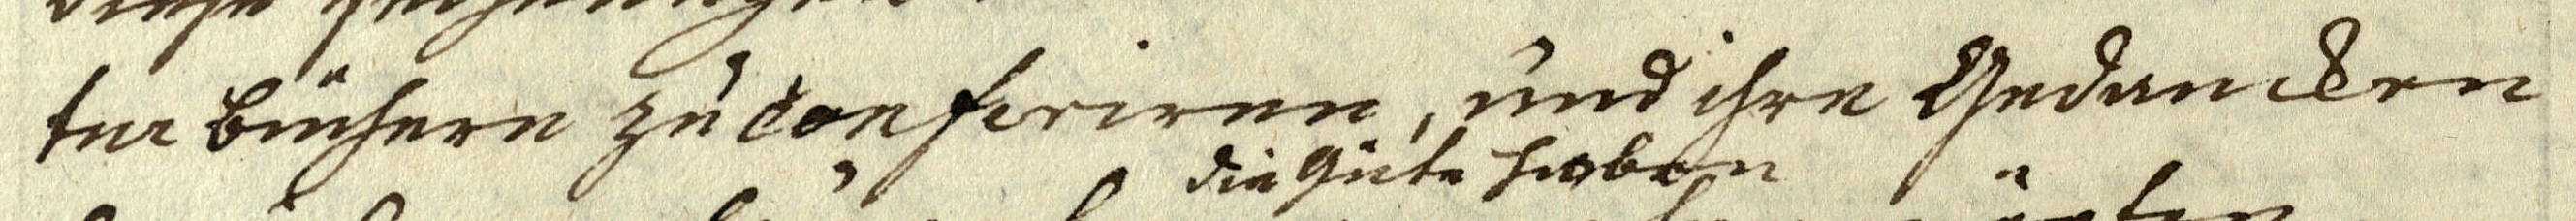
tur Büchern zu conferiren, und ihre Gedancken
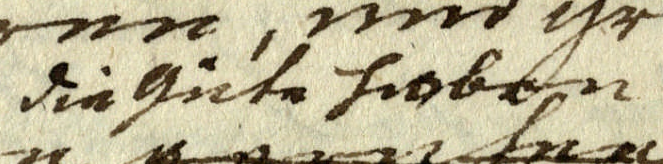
die Güte haben
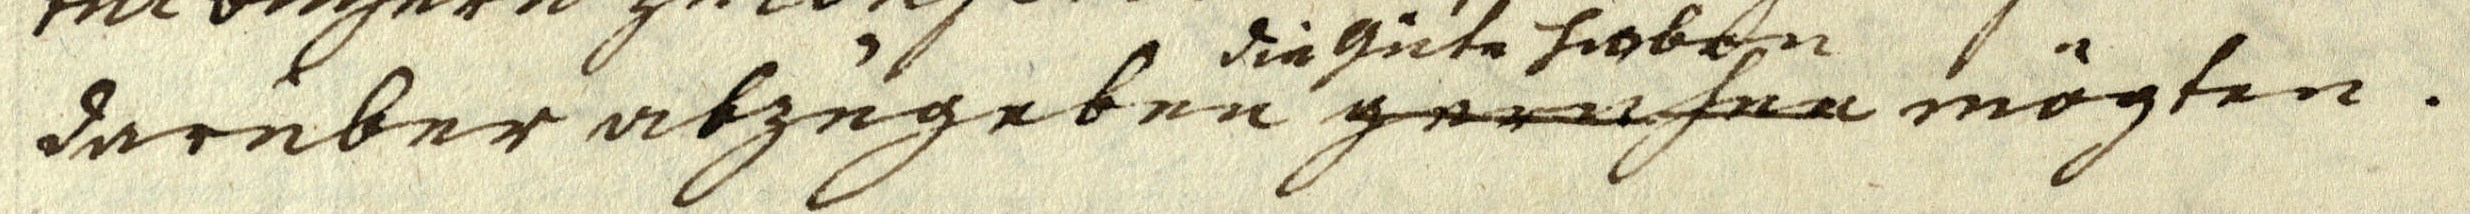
darüber abzugeben geruhen mögten.
